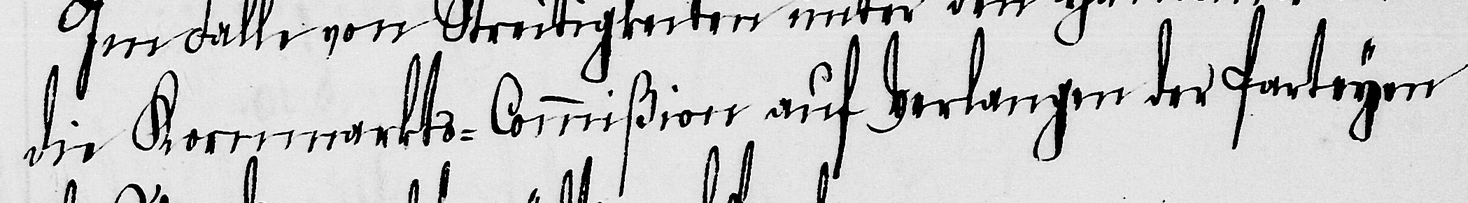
die Kornmarkts-Commißion auf Verlangen der Parteyen
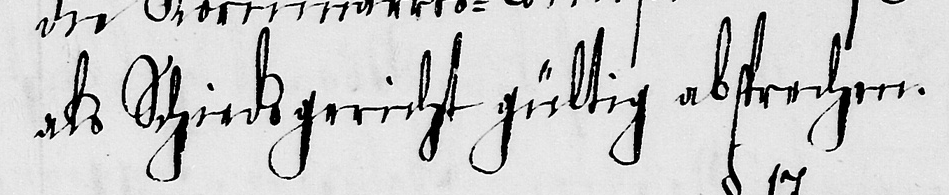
als Schiedsgericht gültig absprechen.
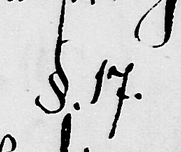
§.17.
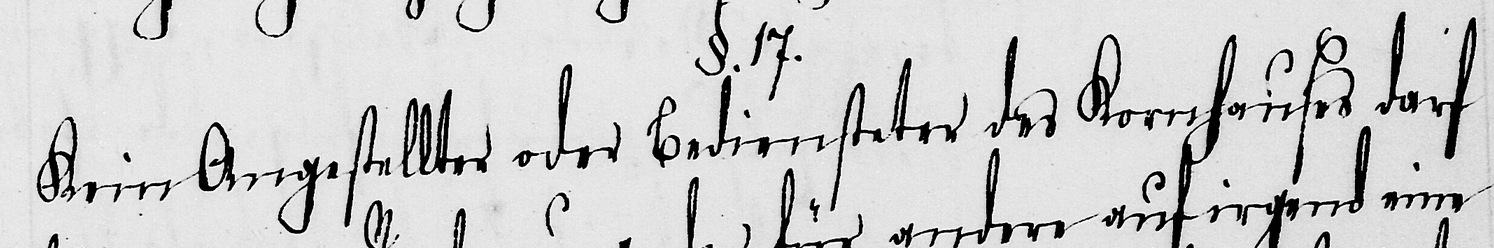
Kein Angestellter oder Bediensteter des Kornhauses darf
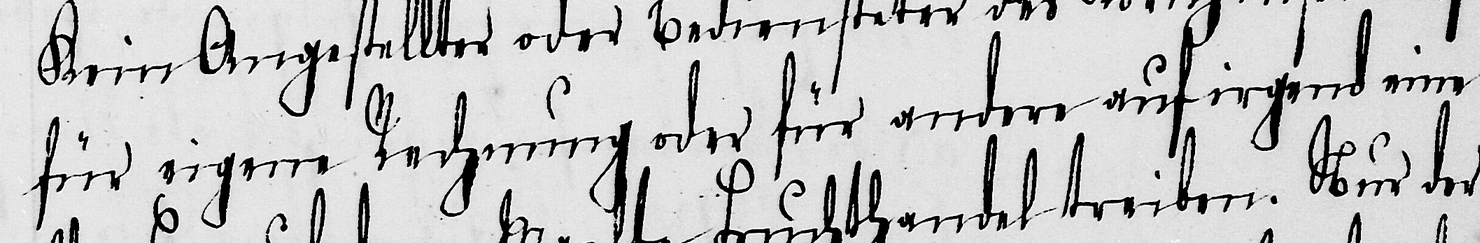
für eigene Rechnung oder für andere auf irgend eine
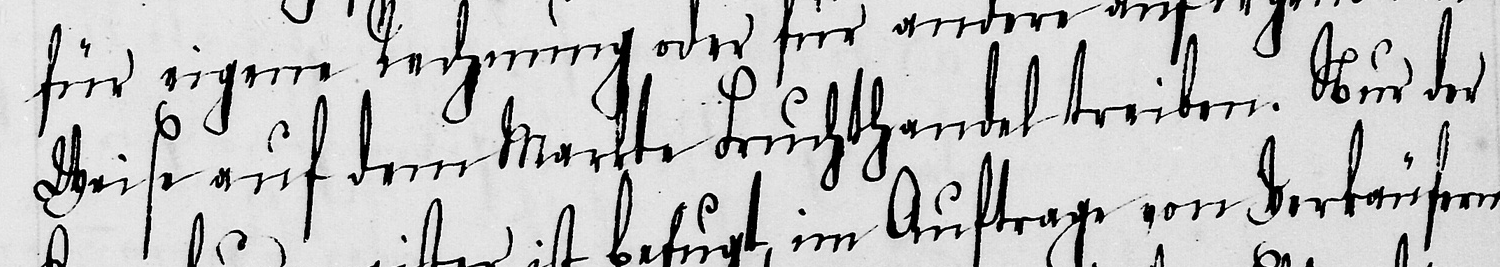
Weise auf dem Markte Fruchthandel treiben. Nur der
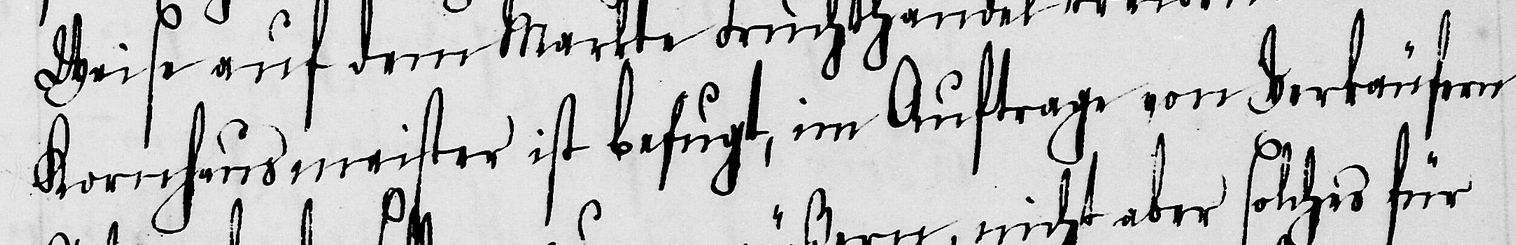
Kornhausmeister ist befugt, im Auftrage von Verkäufern
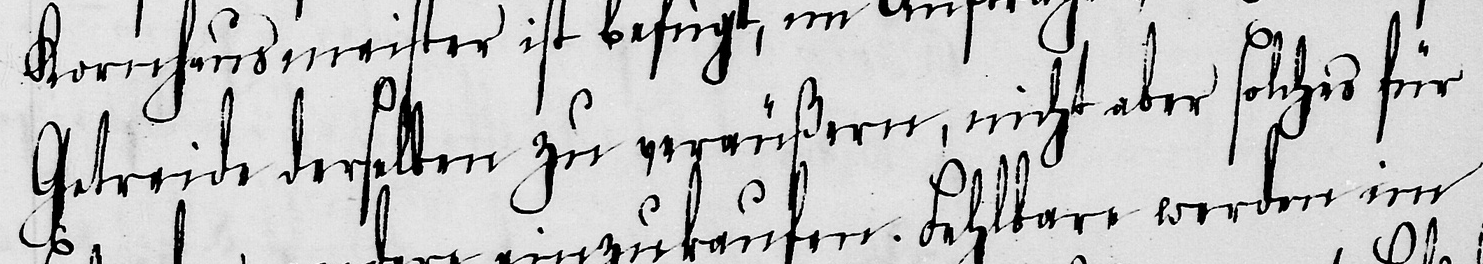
Getreide derselben zu veräußern, nicht aber solches für
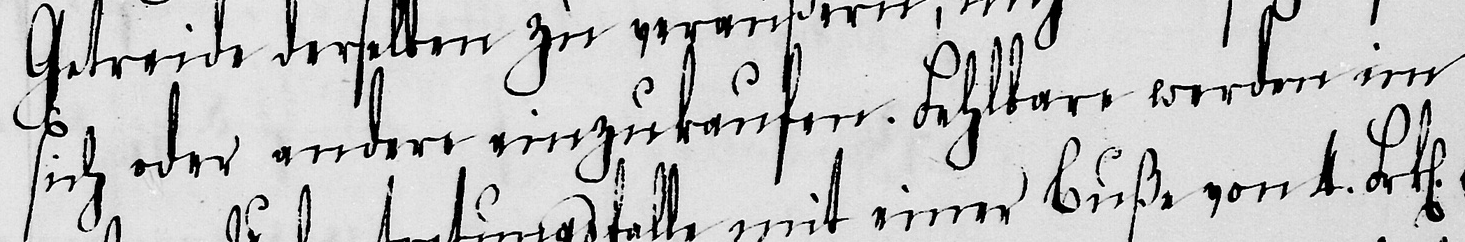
sich oder andere einzukaufen. Fehlbare werden im
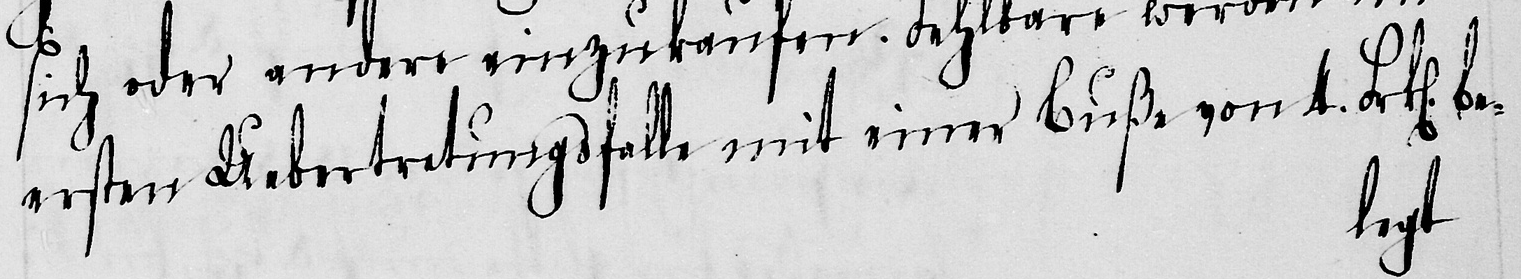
ersten Uebertretungsfalle mit einer Buße von 4. Frk[en].
